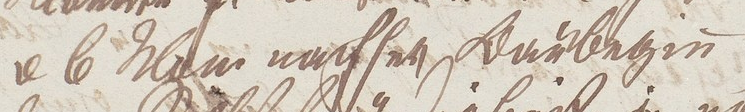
& 6 Mon. nachher Baubeginn)
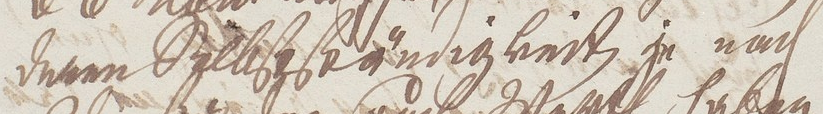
deren Selbstständigkeit je nach
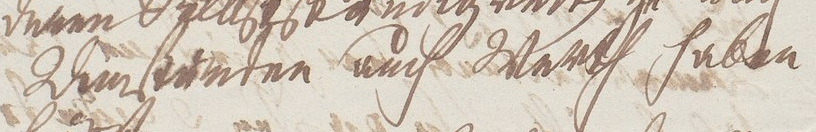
Umständen auch Werth haben
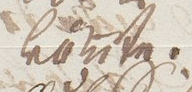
könnte.
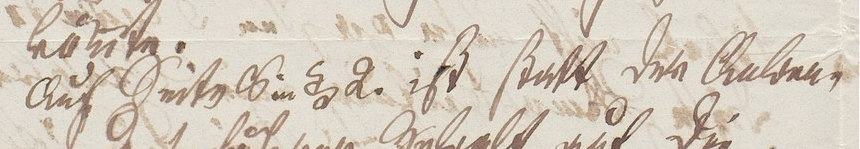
Auf Seite 8 in § 2. ist statt der Anwen-
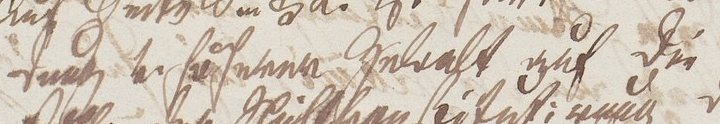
dung v. höherer Gewalt auf die
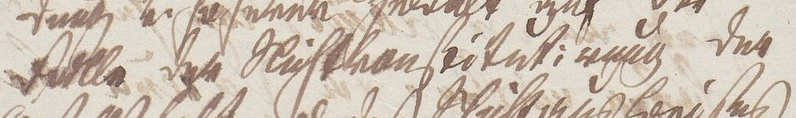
Fälle der Nichtkonstitutirung der
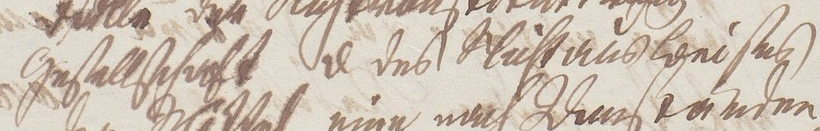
Gesellschaft & des Nichtausweises
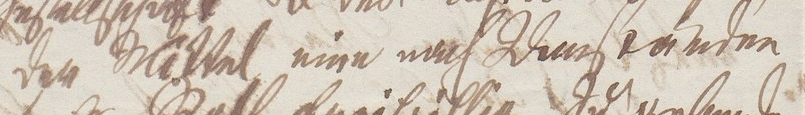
der Mittel eine nach Umständen
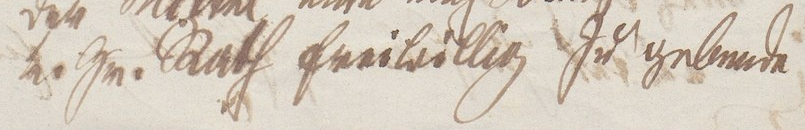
v. Gr. Rath freiwillig zu gebende
